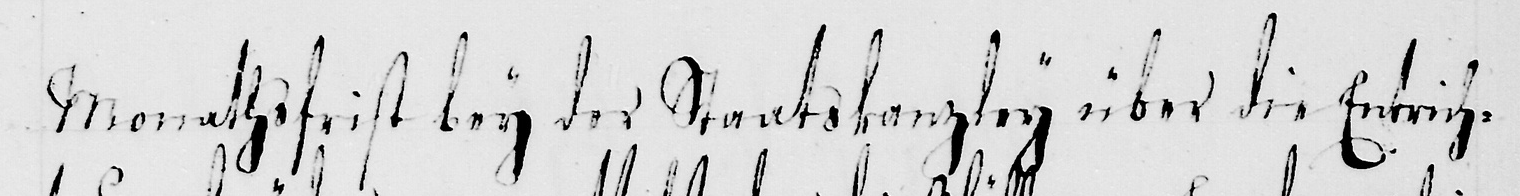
Monathsfrist bey der Staatskanzley über die Entrich¬
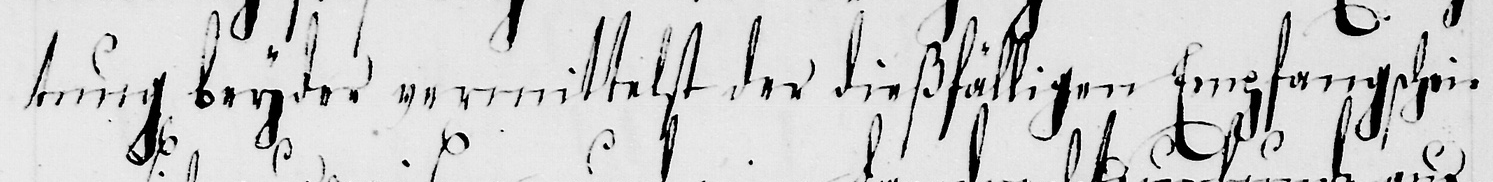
tung beyder vermittelst der dießfälligen Empfangschei¬
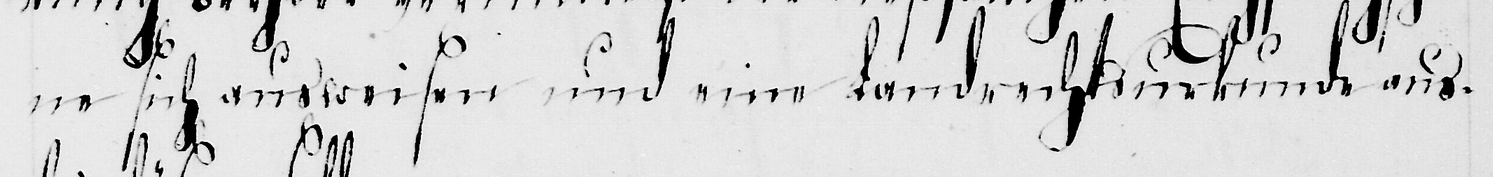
ne sich ausweisen und eine Landrechtsurkunde aus¬
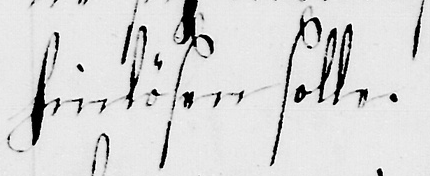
hinlösen soll¬
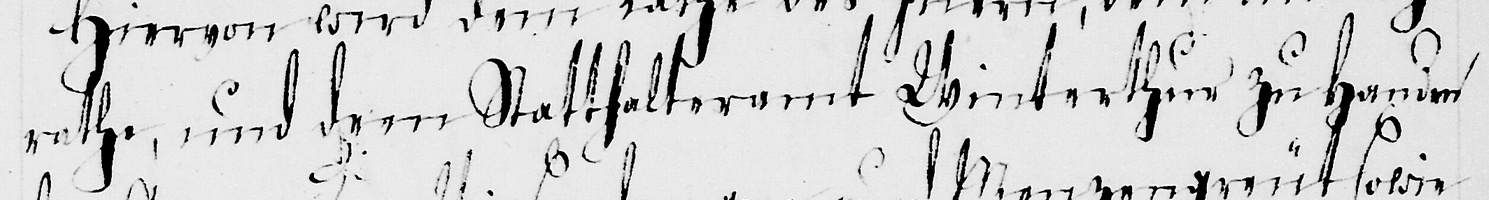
rathe, und dem Statthalteramt Winterthur zu Handen
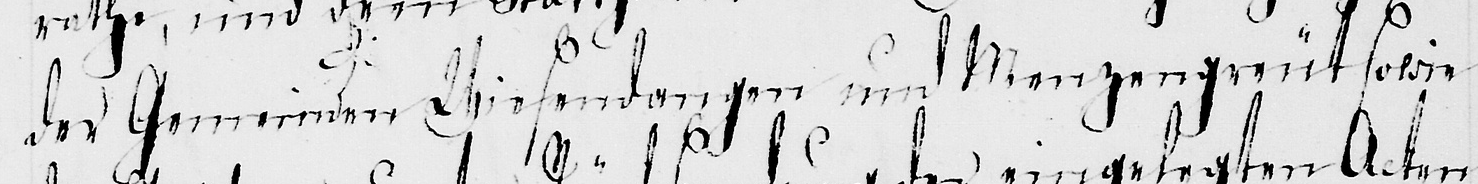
der Gemeinden Wiesendangen und Manzengreut sowie
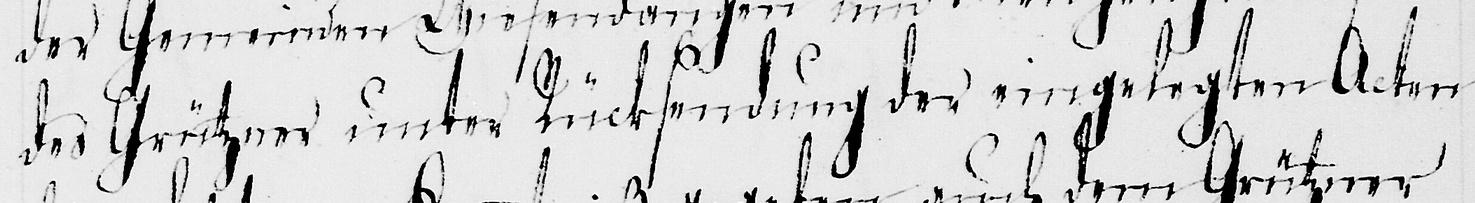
des Grützner unter Rücksendung der eingelegten Acten
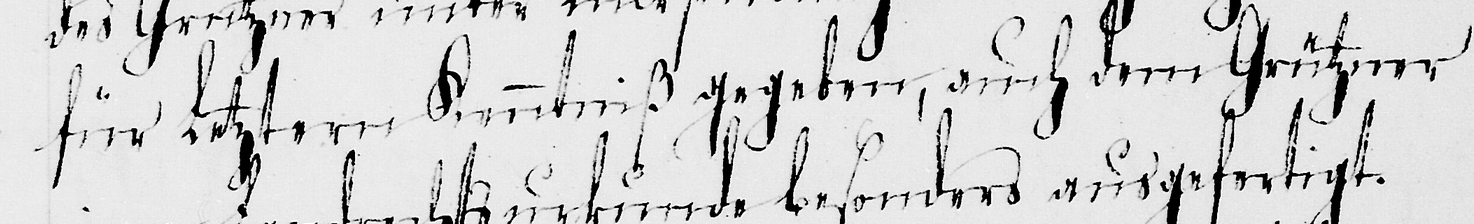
für Letztern Kenntniß gegeben, auch dem Grützner
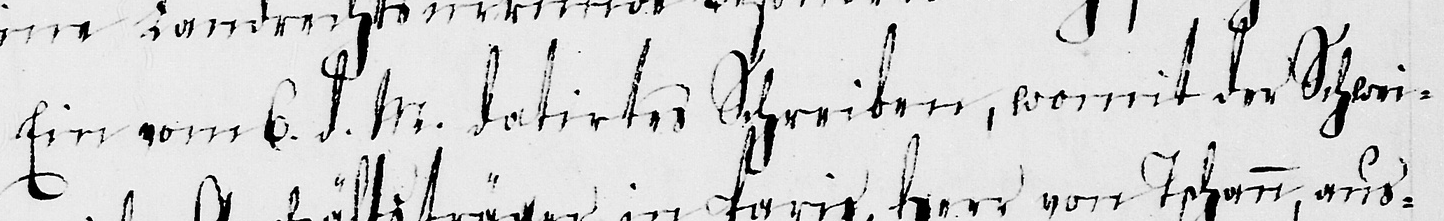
Ein vom 6. d. M. datirtes Schreiben, womit der Schwei¬
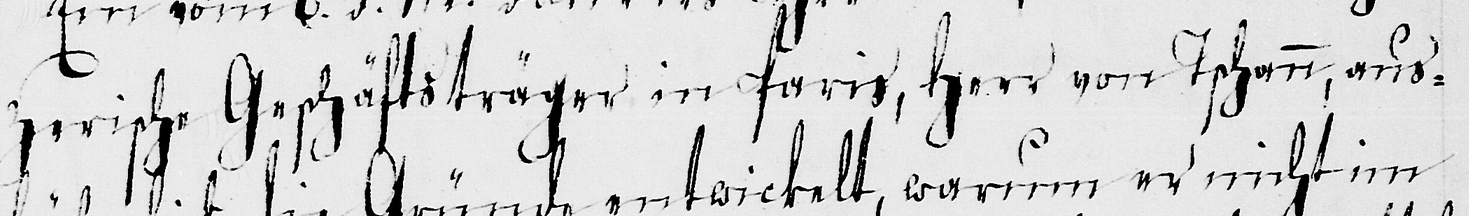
zerische Geschäftsträger in Paris, Herr von Tschann, aus¬
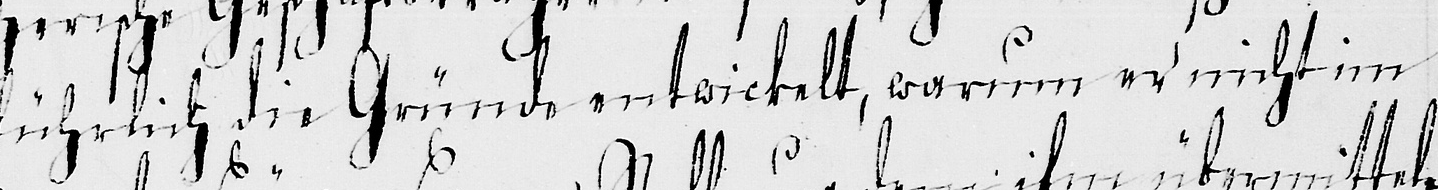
führlich die Gründe entwickelt, warum er nicht im
